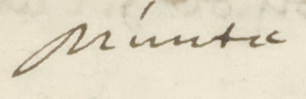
Munte
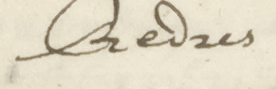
Redres
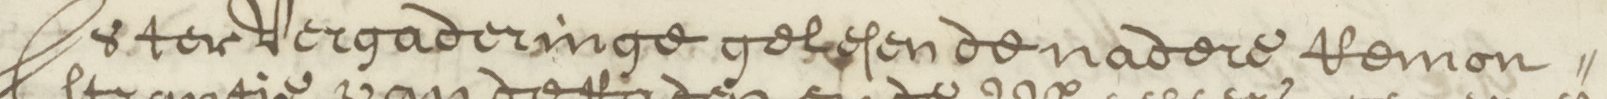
Is ter Vergaderinge gelesen de nadere Remon„
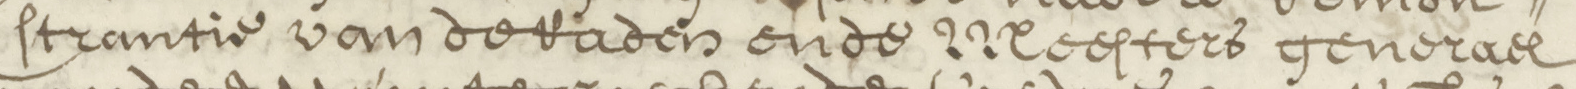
strantie van de Raden ende Meesters generael
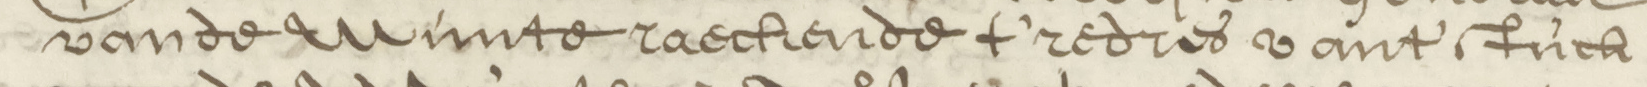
vande Munte raeckende t'redres vant' stuck
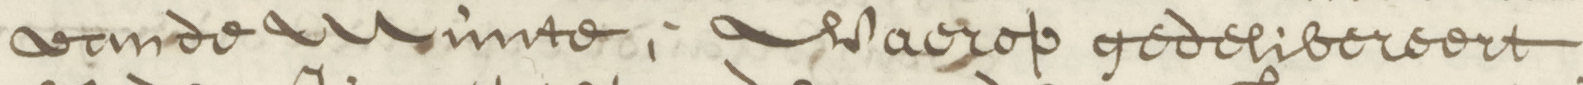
vande Munte; Waerop gedelibereert
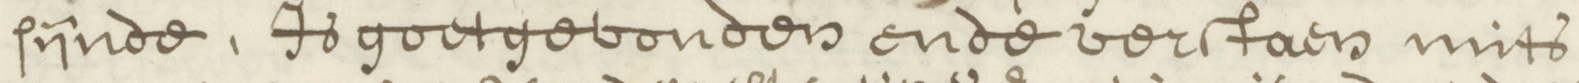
sijnde, Is goetgevonden ende verstaen mits
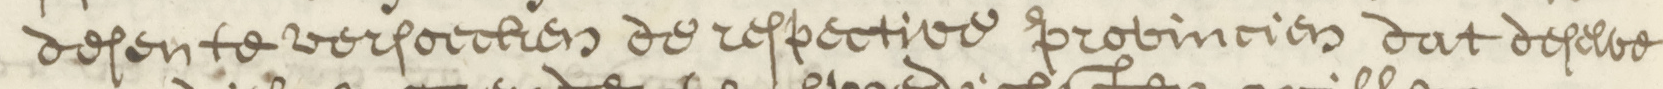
desen te versoecken de respective provincien dat deselve
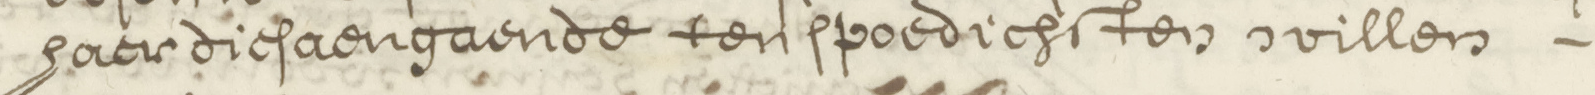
haer diesaengaende ten spoedichsten willen -
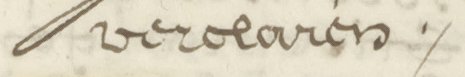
verclaren.
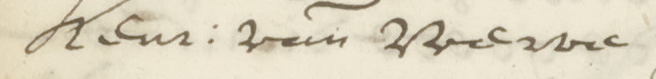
Henr: van Werve
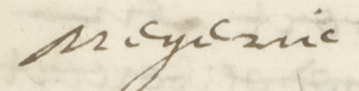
Meyerie
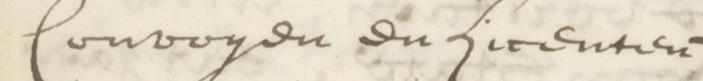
Convoyen en Licenten
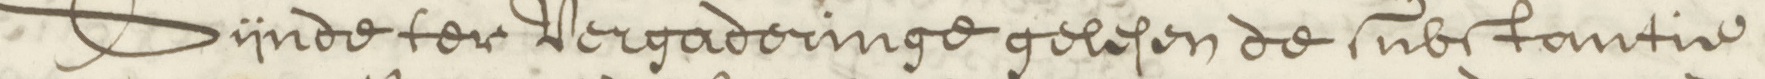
Sijnde ter Vergaderinge gelesen de substantie
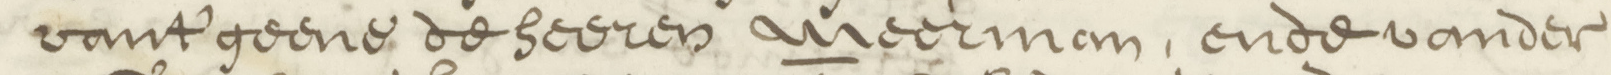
vant' geene de heeren Meerman, ende vander
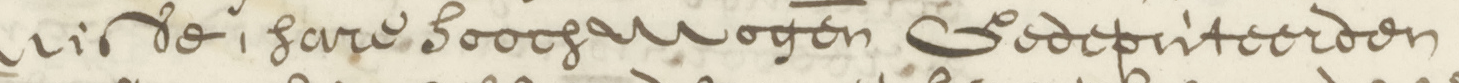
Witte, hare hooch Mogen Gedeputeerden,
